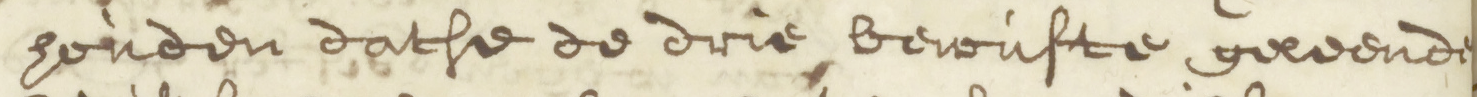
houden datse de drie bewuste geleende
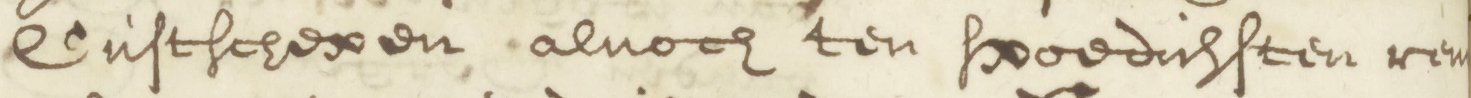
Custschepen alnoch ten spoedichsten rem„
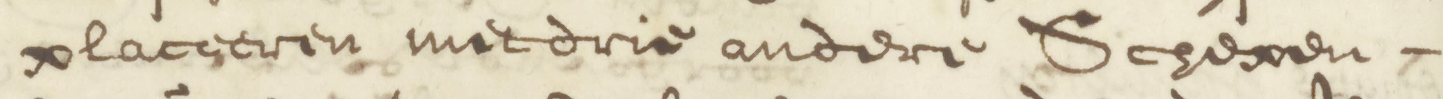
placeren met drie andere Schepen -
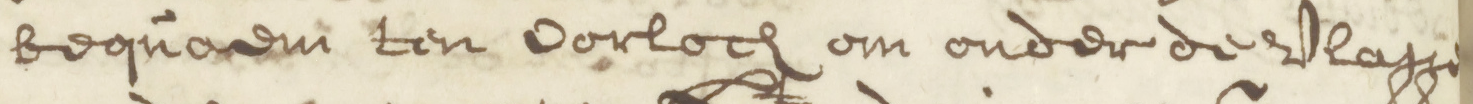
bequaem ten Oorloch om onder de Vlagge
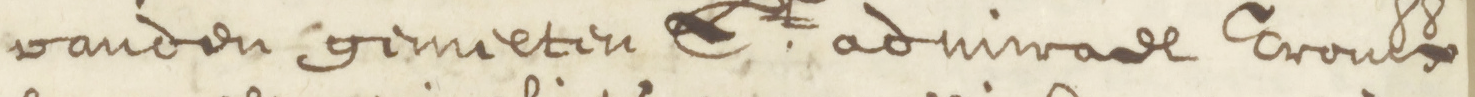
vanden gemelten Lt. admirael Tromp
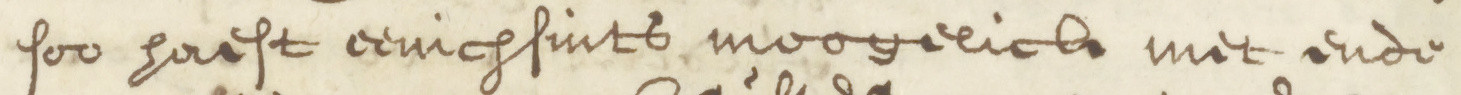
soo haest eenchsints moogelick met ende
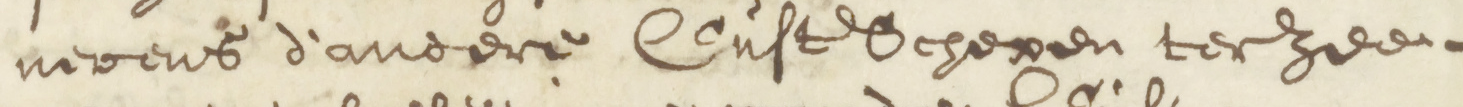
nevens d‛andere CustSchepen ter Zee
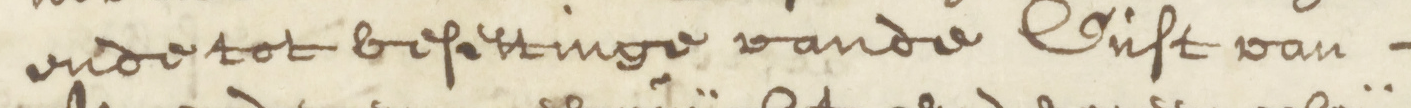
ende tot besettinge vande Cust van
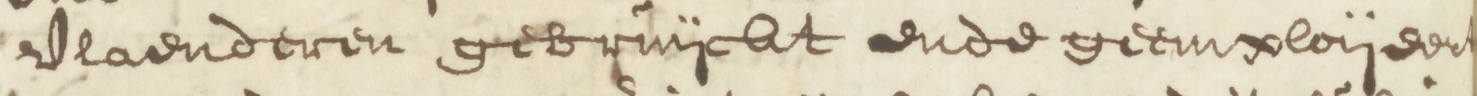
Vlaenderen gebruijckt ende geemploijeert
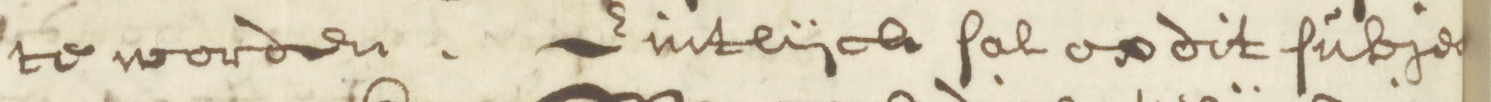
te worden. Eintlijck sal op dit subjec
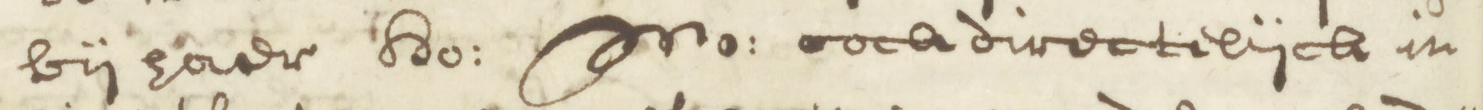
bij haer Ho:Mo: oock directelijck in
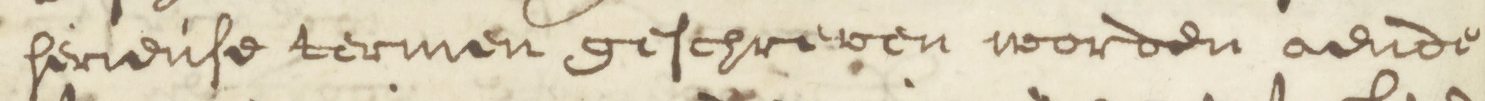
serieuse termen geschreven worden aende
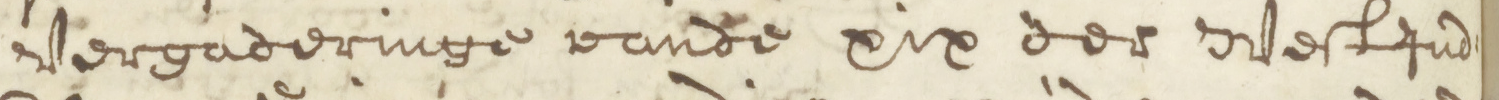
Vergaderinge vande xix der WestInd.
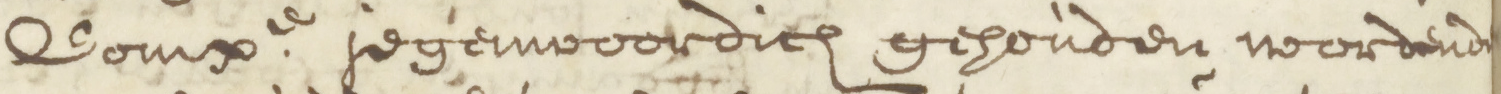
Compe. jegenwoordich gehouden wordende
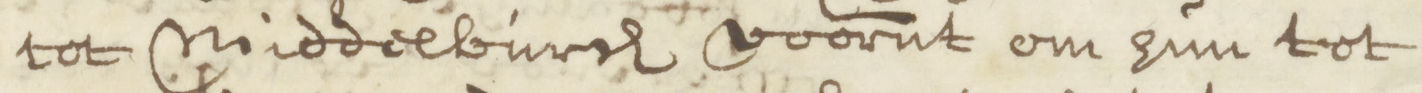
tot Middelburch voornt om hun tot —
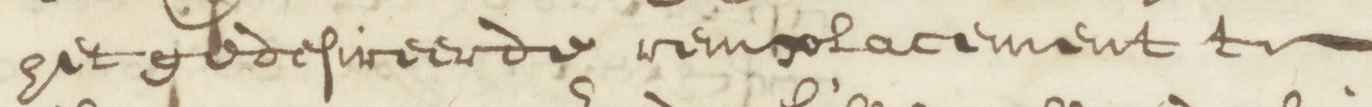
het gedesireerde remplacement te
